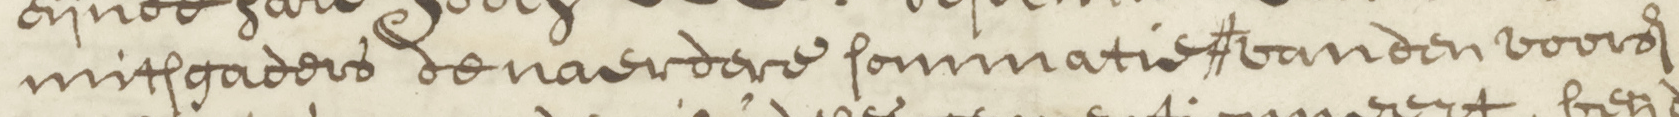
mitsgaders de naerdere sommatie # vanden voors
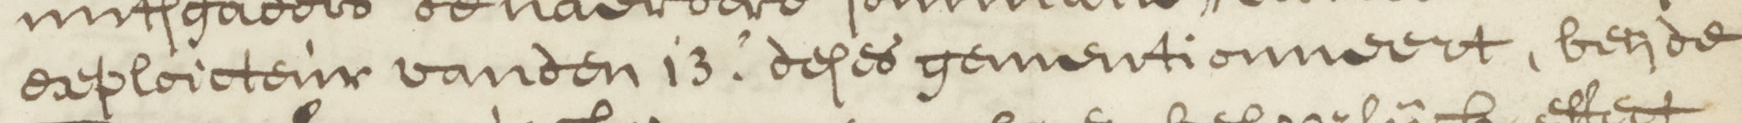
exploicteur vanden 13e. deses gementionneert, beijde
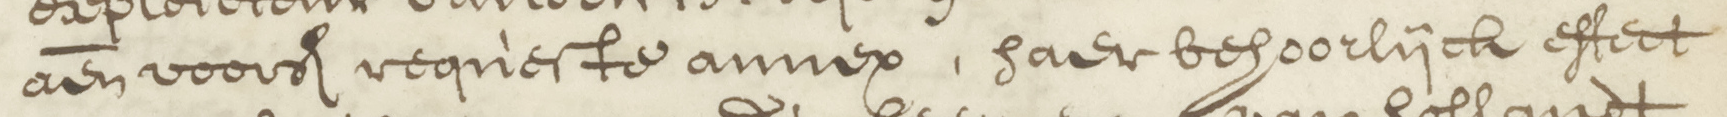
aen voors requeste annex, haer behoorlijck effect
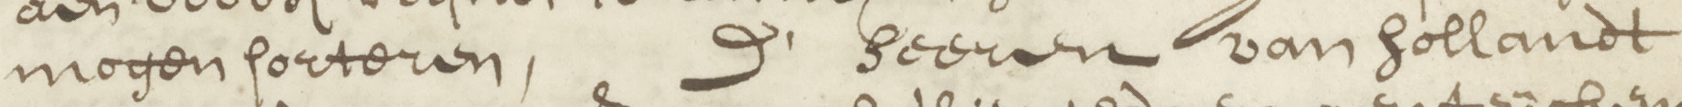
mogen sorteren. D‛ heeren van hollandt
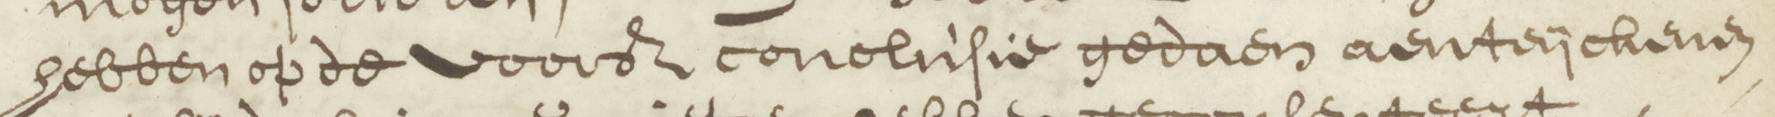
hebben op de voors conclusie gedaen aenteijckenen
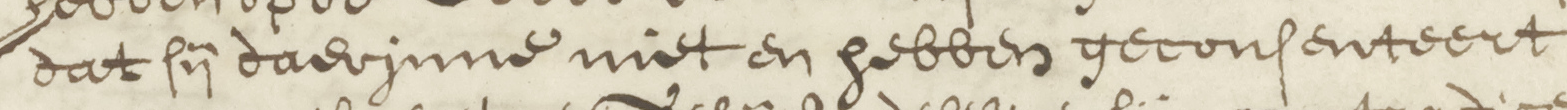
dat sij daerinne niet en hebben geconsenteert,
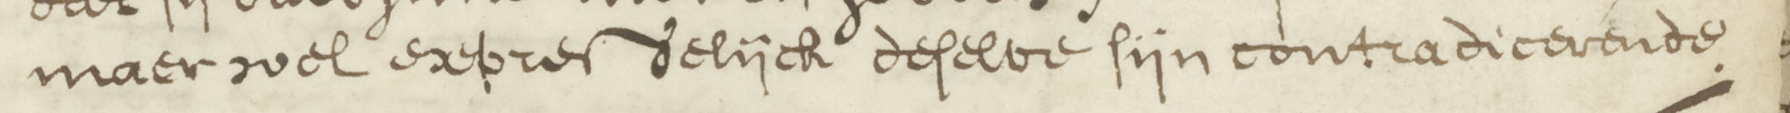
maer wel expresselijck deselve sijn contradicerende.
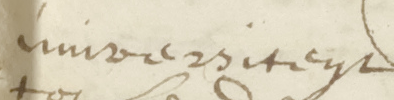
Universiteyt
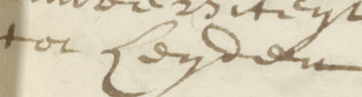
tot Leyden
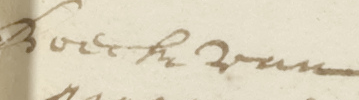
Boeck van
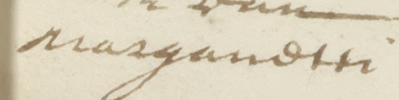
Marganetti
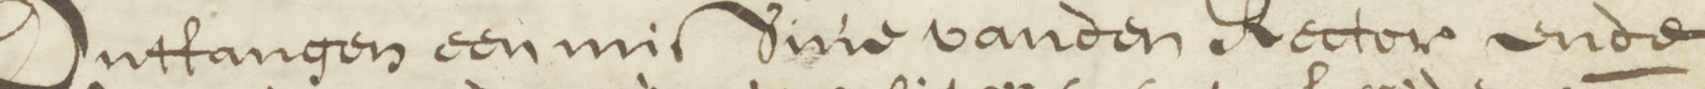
Ontfangen een missiue vanden Rector ende
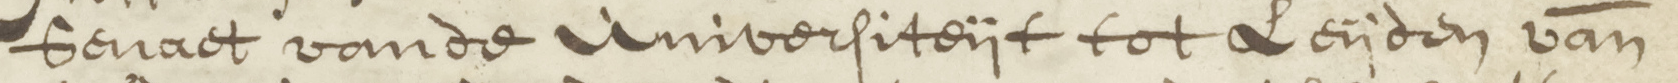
Senaet vande Universiteijt tot Leijden van
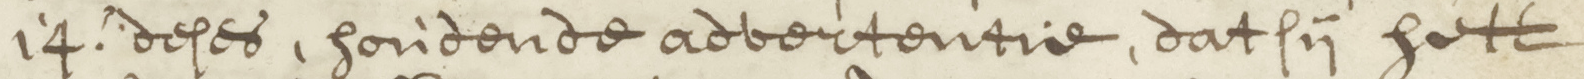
14e. deses, houdende advertentie, dat sij hett
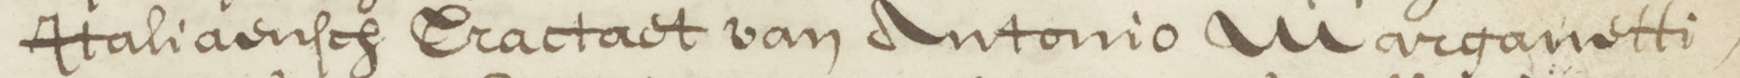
Italiaensch Tractaet van Antonio Marganetti,
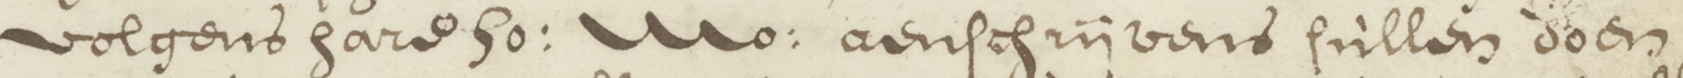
volgens hare ho:Mo: aenschrijvens sullen doen
